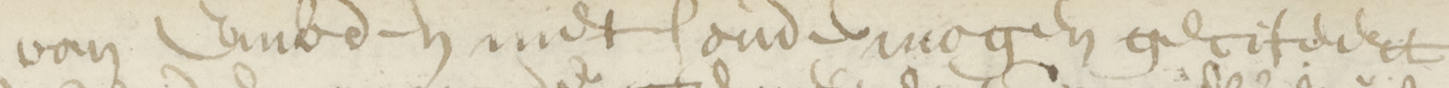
van Embden niet soude mogen geciteert
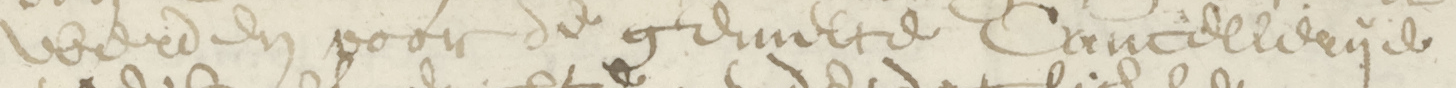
werden voor de gemelte Cancellerije
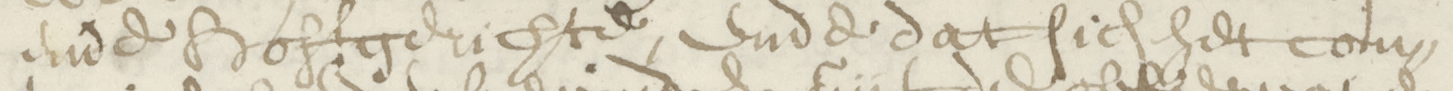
ende Hoffgerichte, ende dat sich het con„
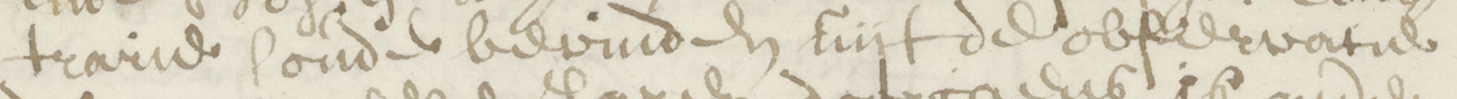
trarie soude bevinden uijt de observatie
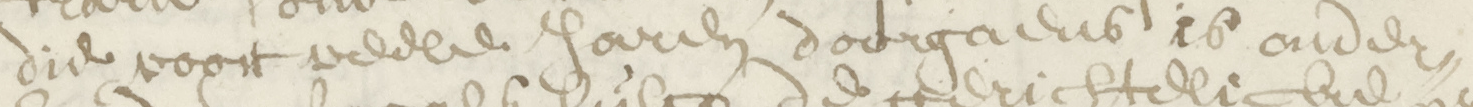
die voor veele Jaren doorgaens is onder„
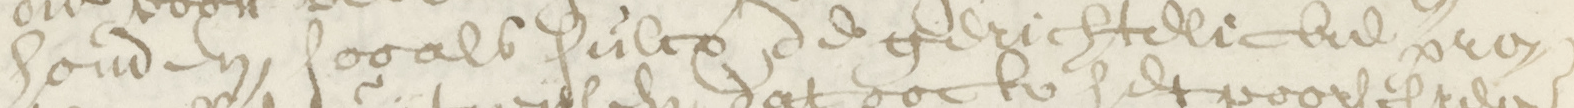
houden, sooals sulcx de gerichtelicke pro„
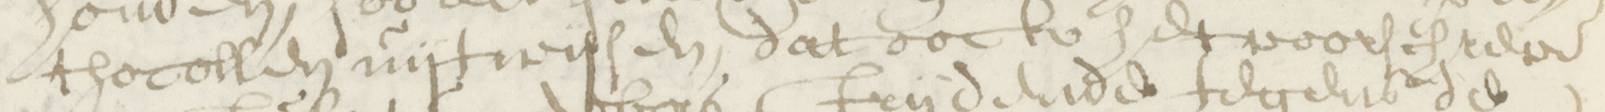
thocollen uijtwissen, dat oock het voorschreve
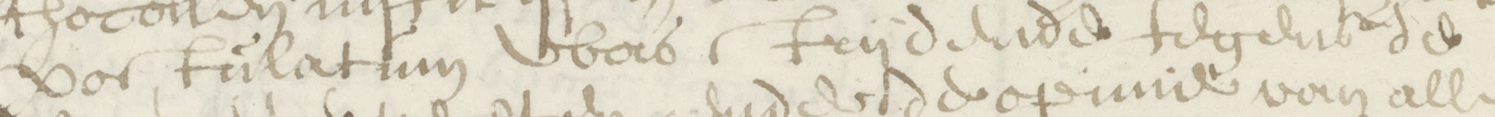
postulatum was strijdende tegens de
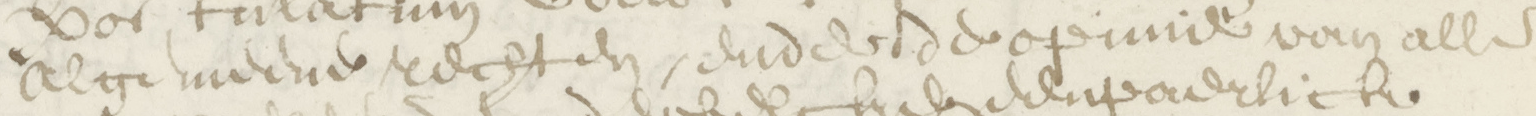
algemeene rechten, ende de opinie van alle
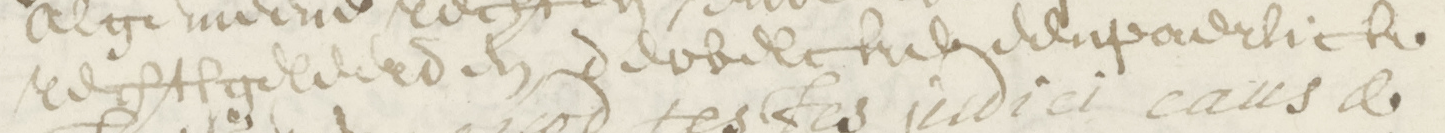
rechtsgeleerden dewelcke eenpaerlick
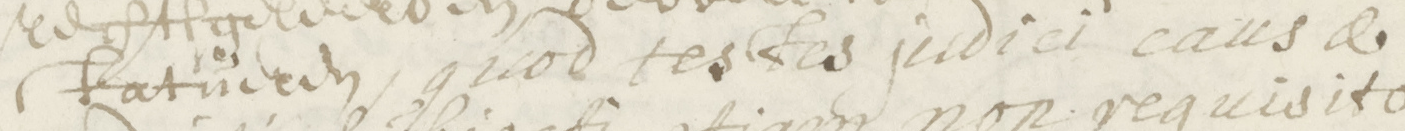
statueren, quod testes judici causa
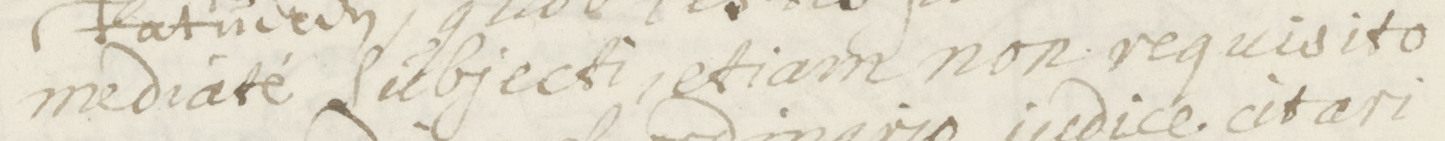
mediate subjecti, etiam non requisito
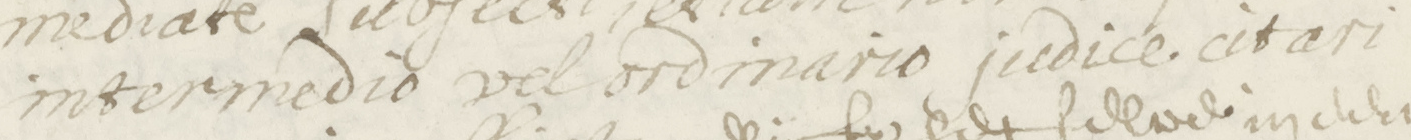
intermedio vel ordinario judice citari
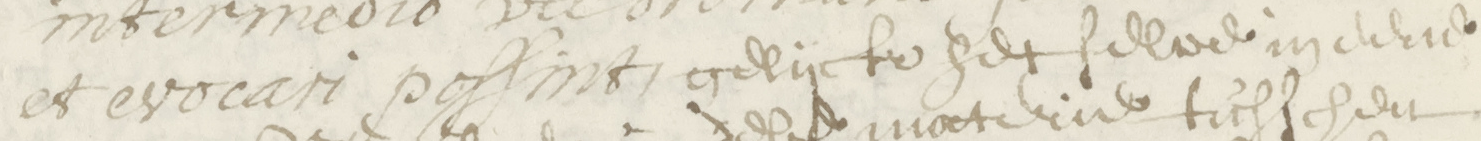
et evocari possint, gelijck het selve ineene
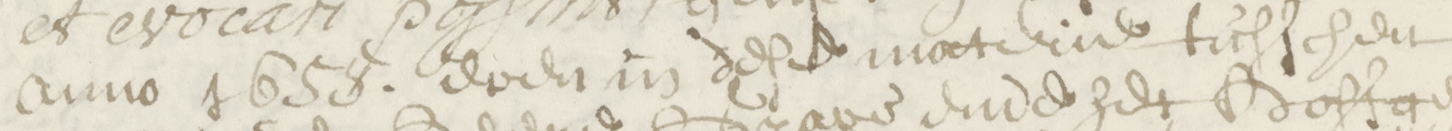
Anno 1655. even in dese materie tusschen
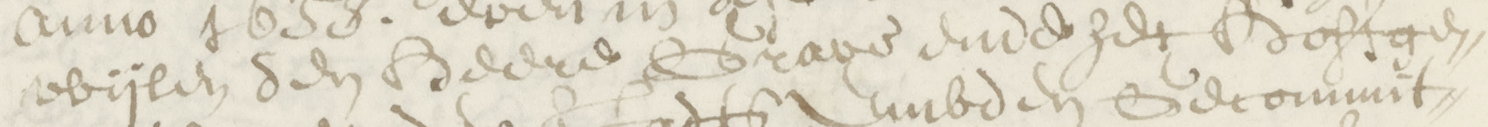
wijlen den Heere Grave ende het Hoffge„
